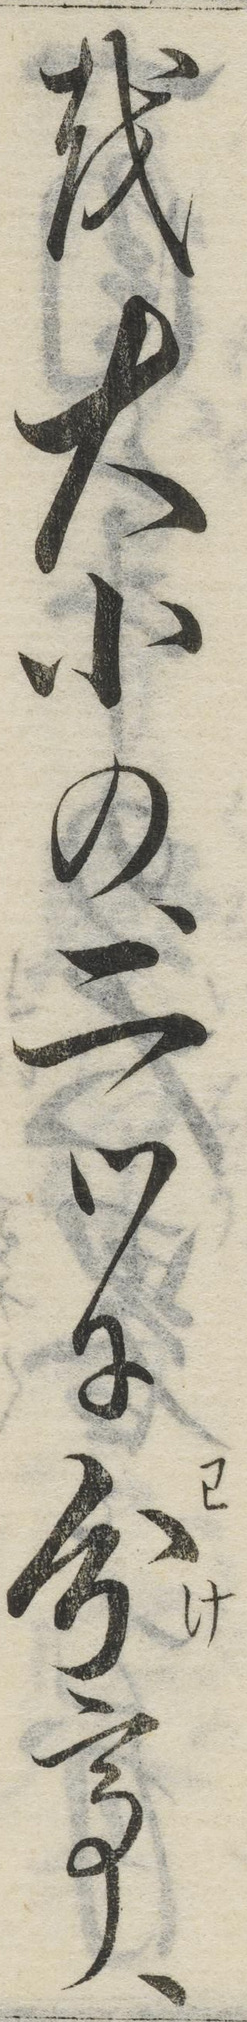を大小の、二ツに分て、
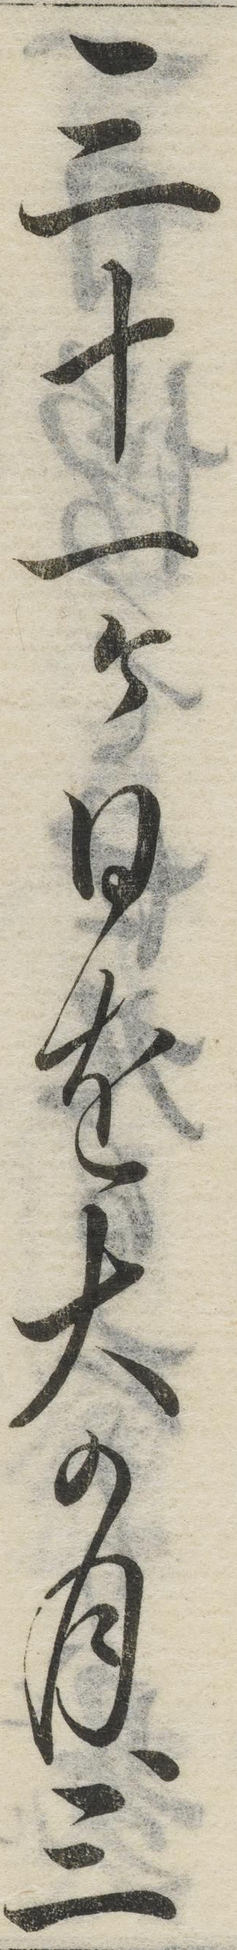三十一ヶ日を大の月、三
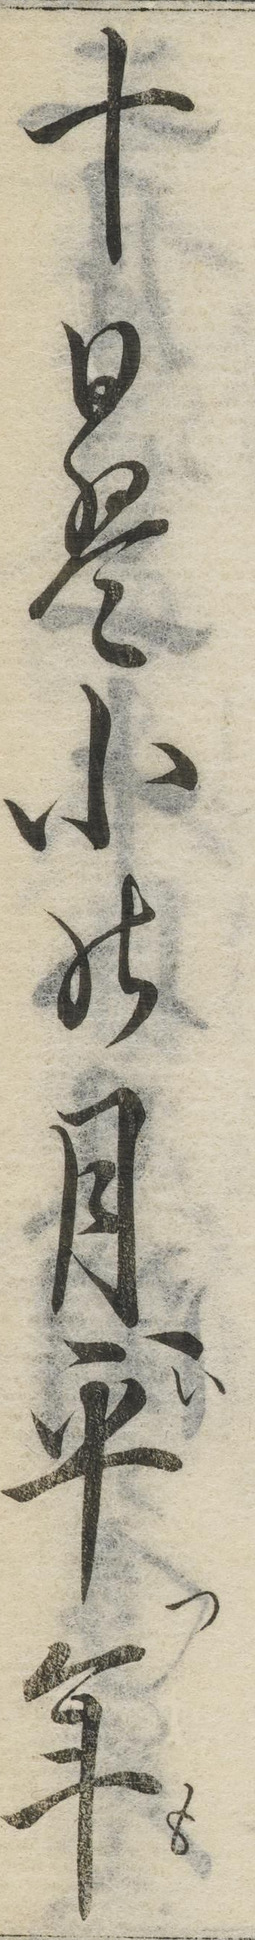十日は小の月、平年

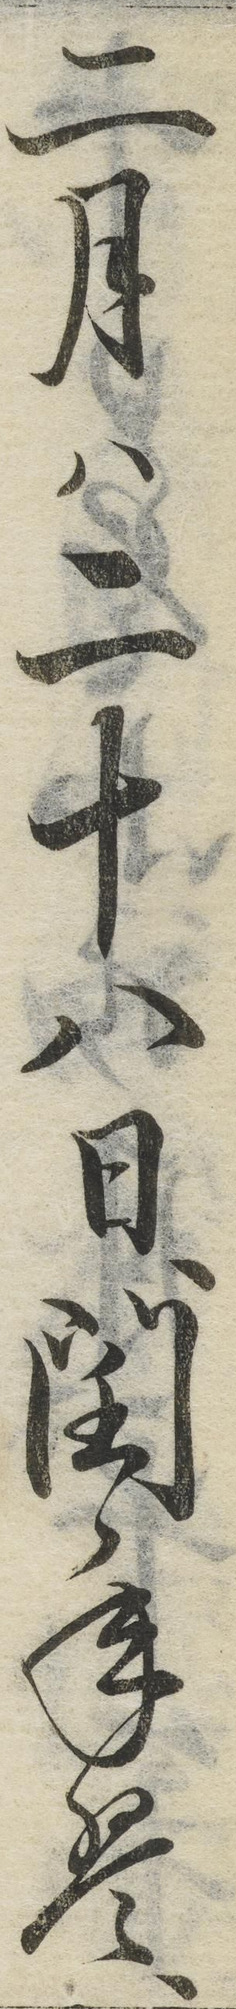二月は二十八日、閏年は、
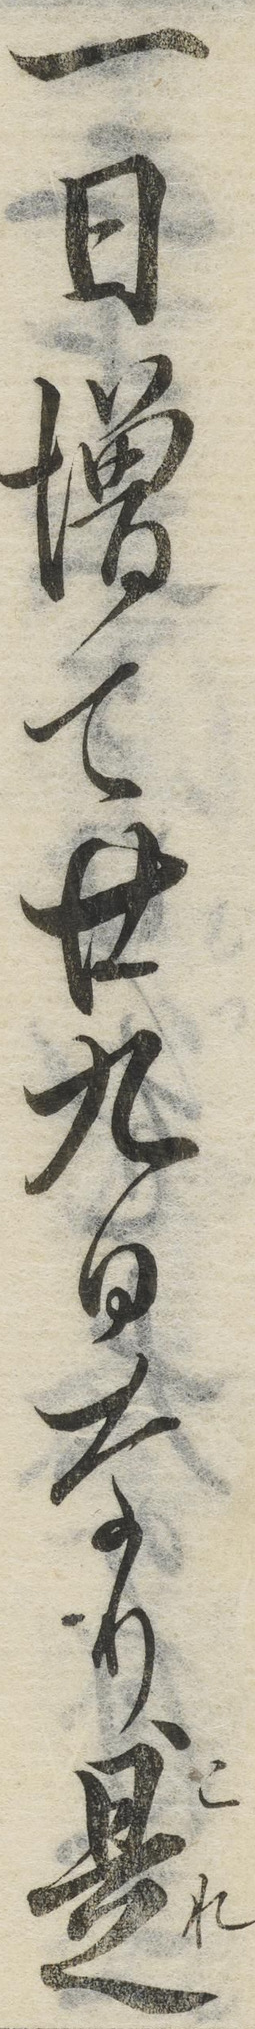一日増て廿九日なり、是
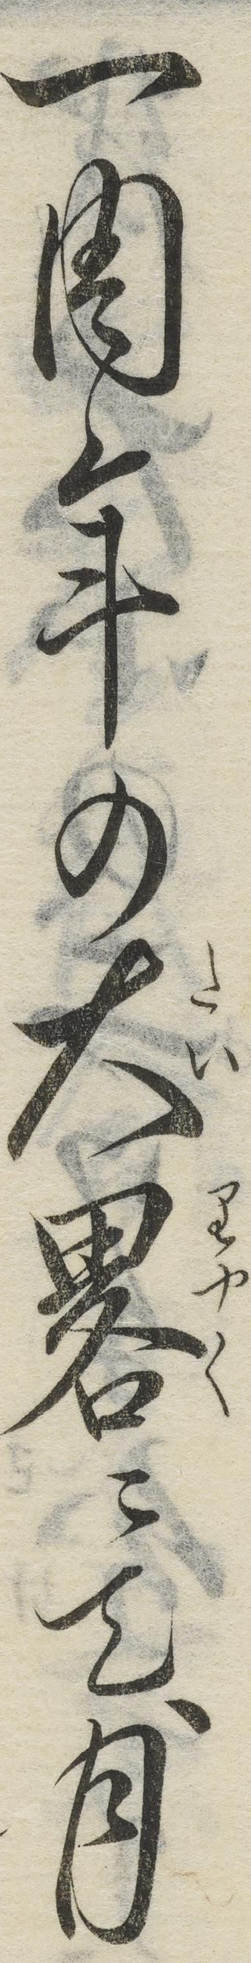一周年の大略ニて、月
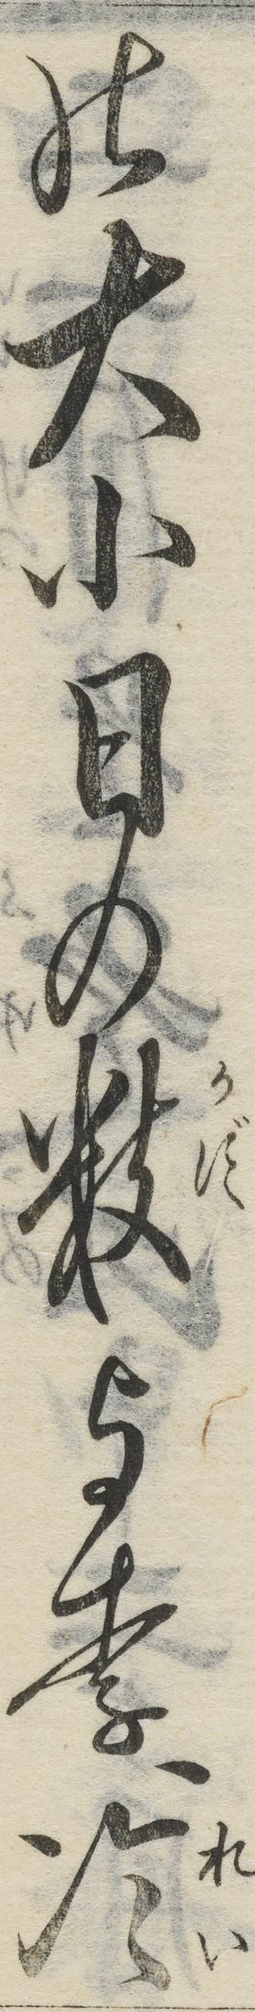の大小日の数より、冷
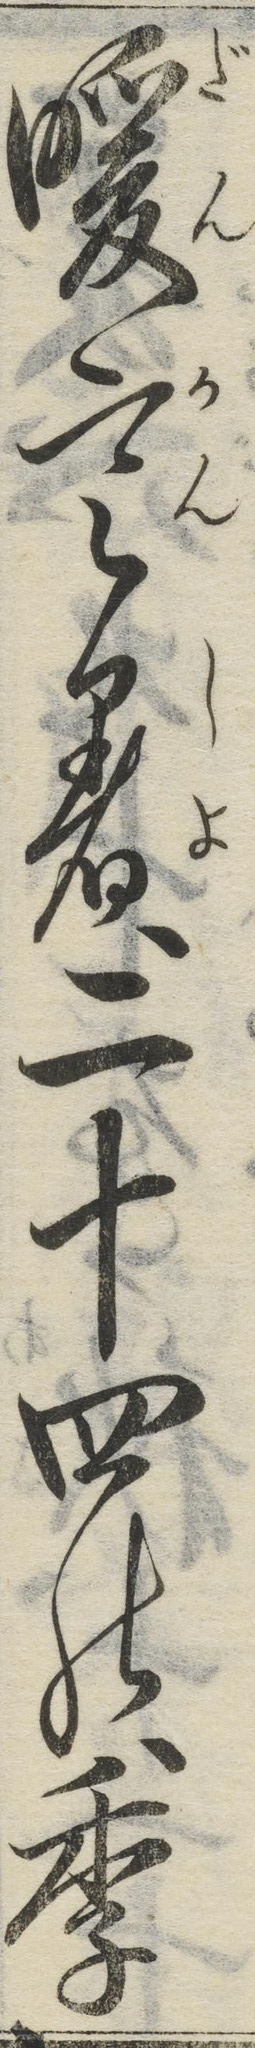暖寒暑、二十四の、季
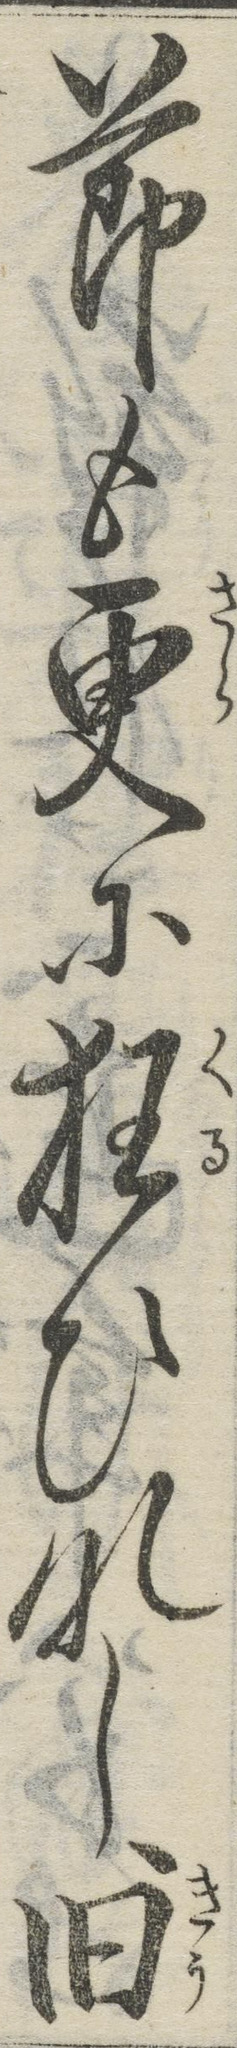節も更に狂ひなし、旧
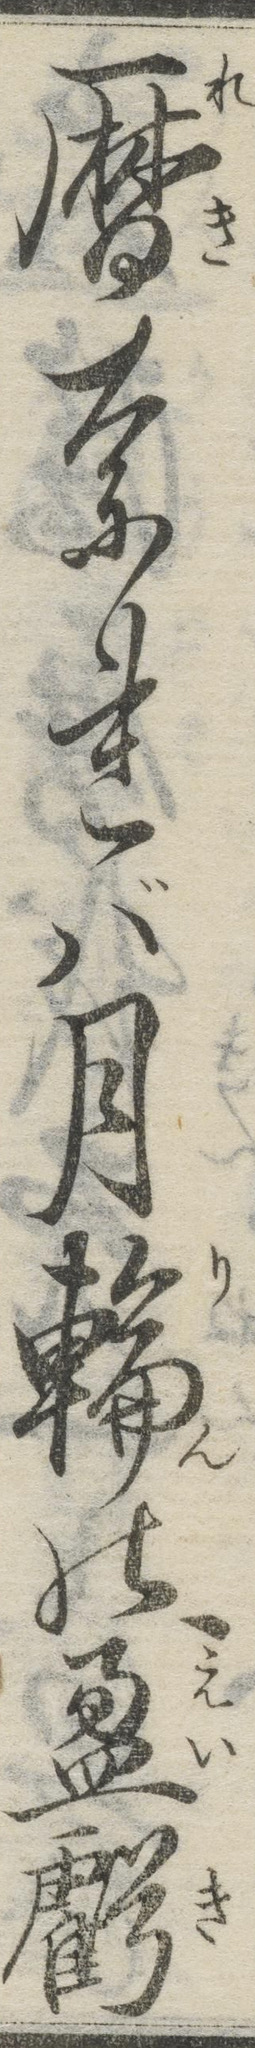暦なれば月輪の、盈虧
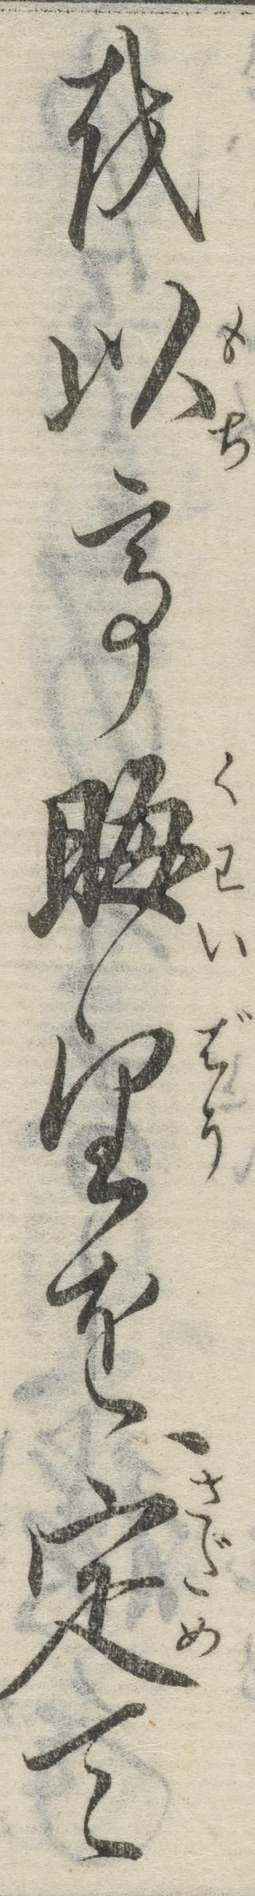を以て晦望を、定て
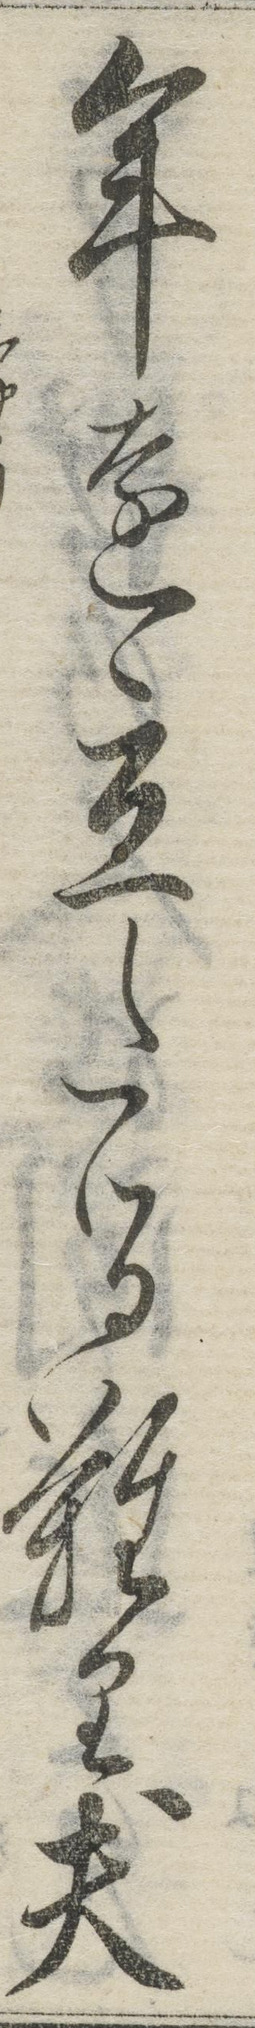年を立たるなり、夫
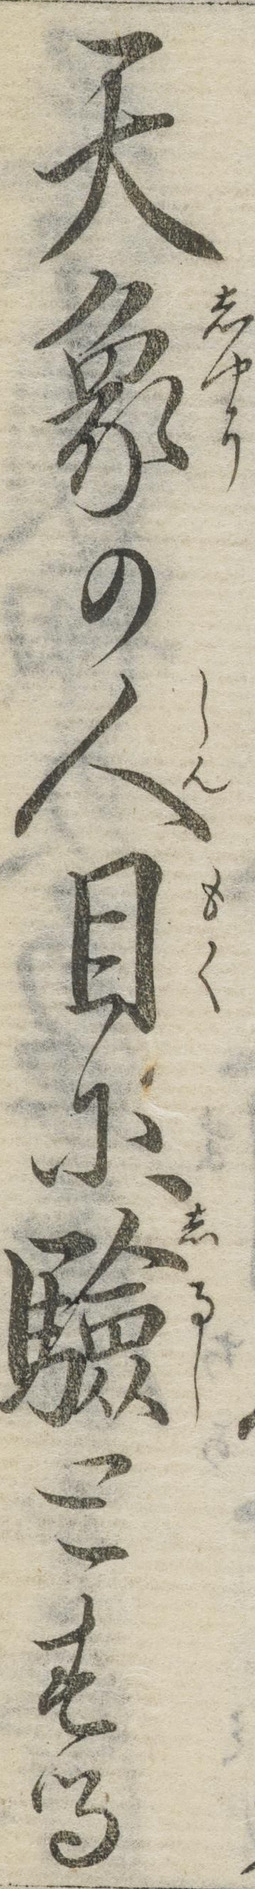天象の人目に、験とする

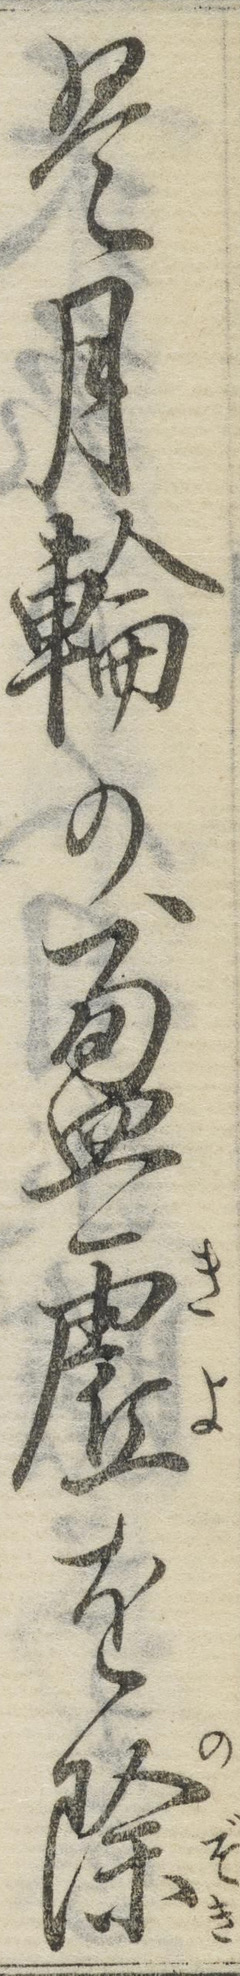は月輪の、盈虚を除
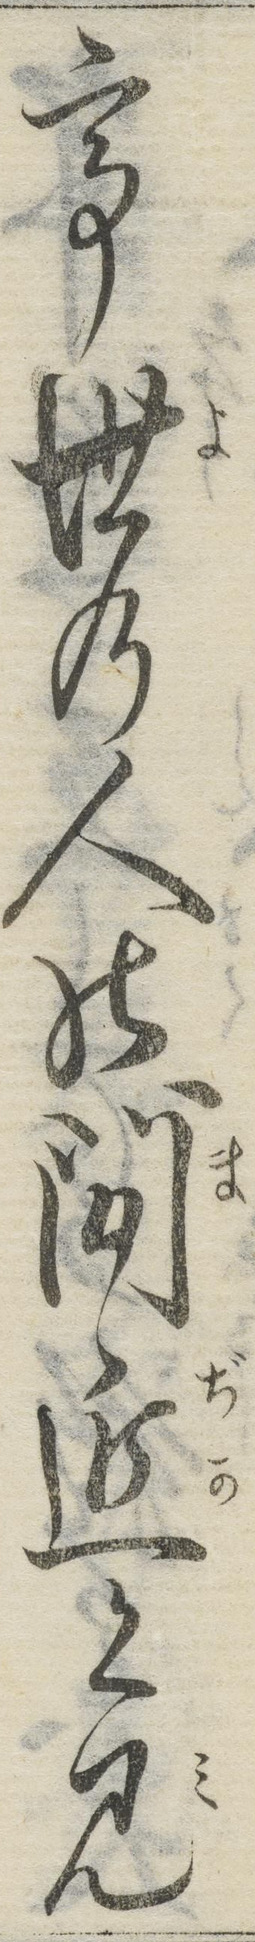て世の人の、間近く見
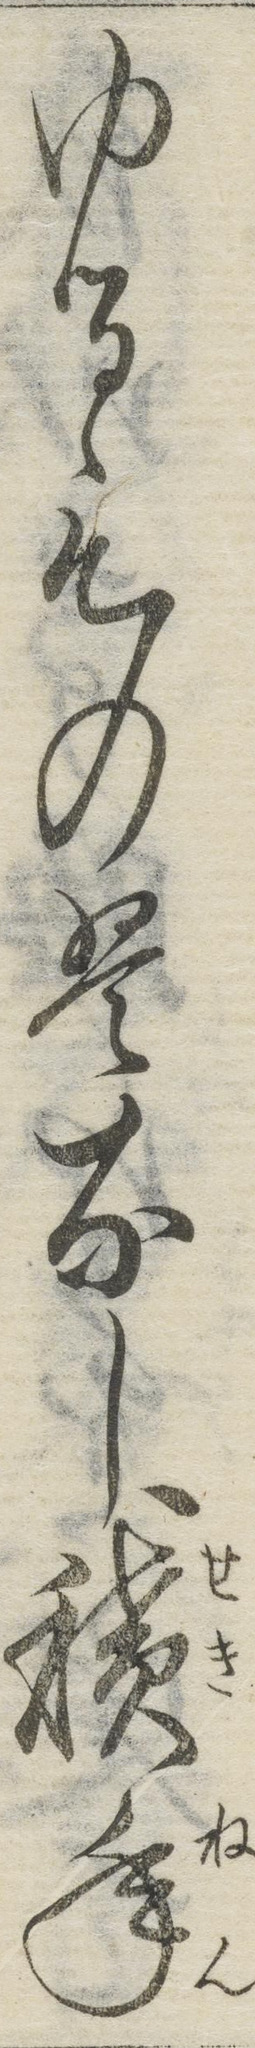ゆるものはなし、積年
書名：暦日往来　單
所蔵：東京大学地震研究所図書室 Earthquake Research Institute Library, The University of Tokyo, JAPAN
